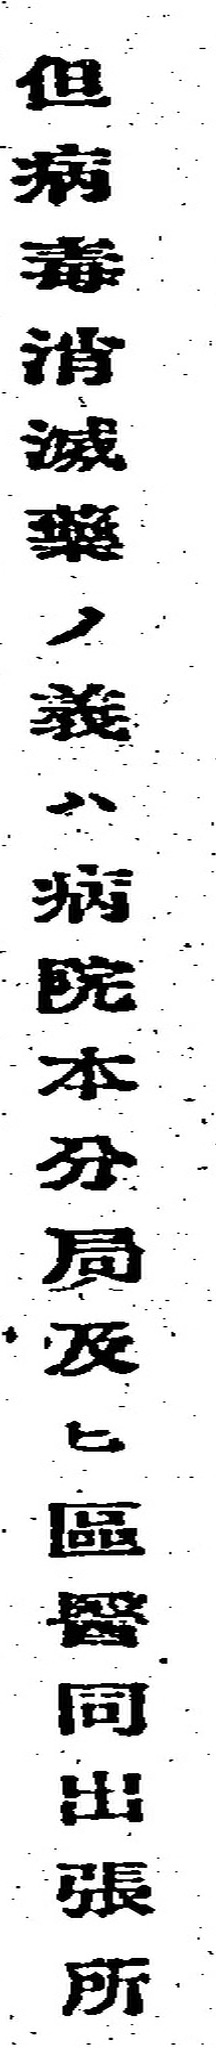但病毒消滅薬ノ義ハ病院本分局及ヒ区医同出張所
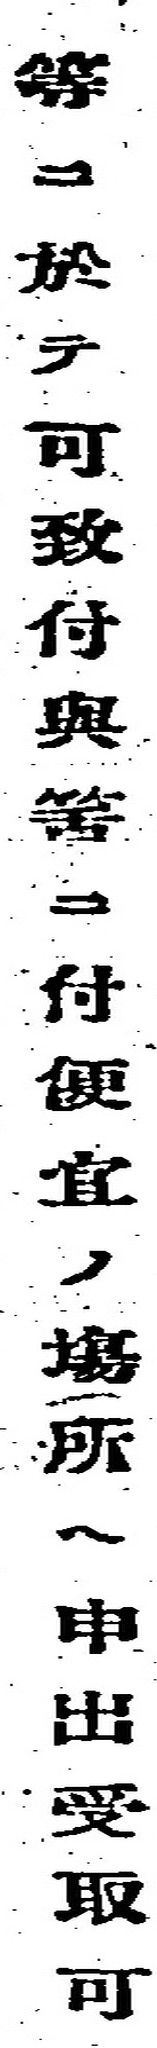等ニ於テ可致付与筈ニ付便宜ノ場所ヘ申出受取可
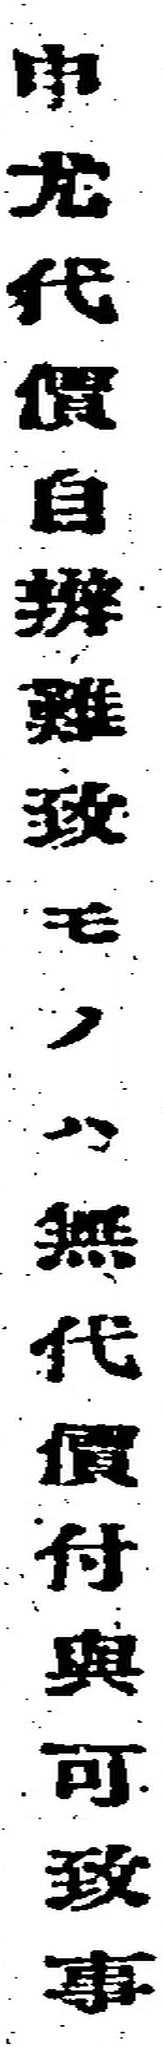申尤代価自弁難致モノハ無代価付与可致事
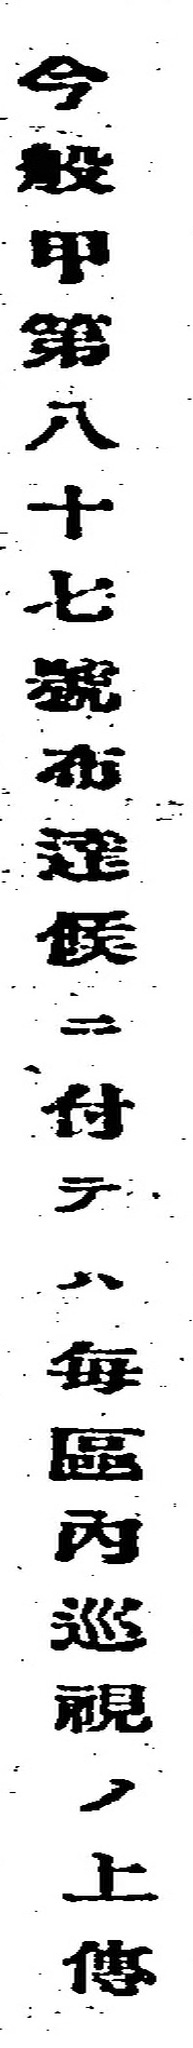今般甲第八十七号布達候ニ付テハ毎区内巡視ノ上伝
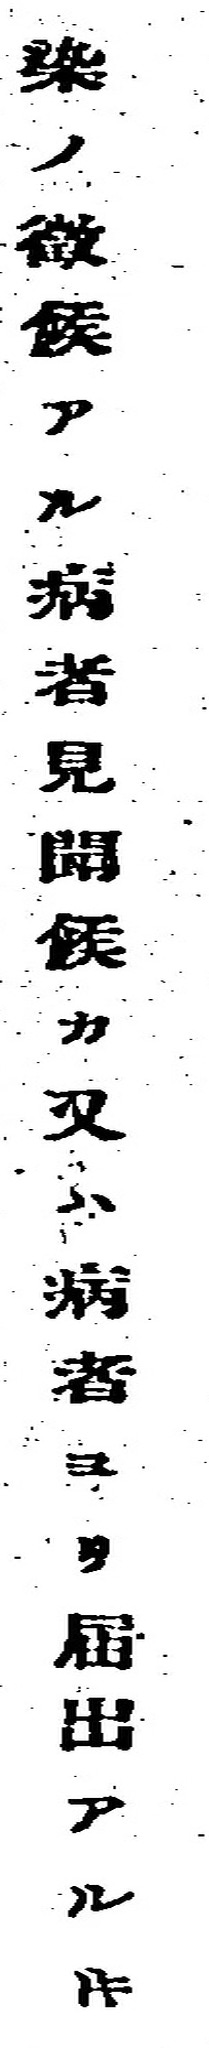染ノ徴候アル病者見聞候カ又ハ病者ヨリ届出アルトキ
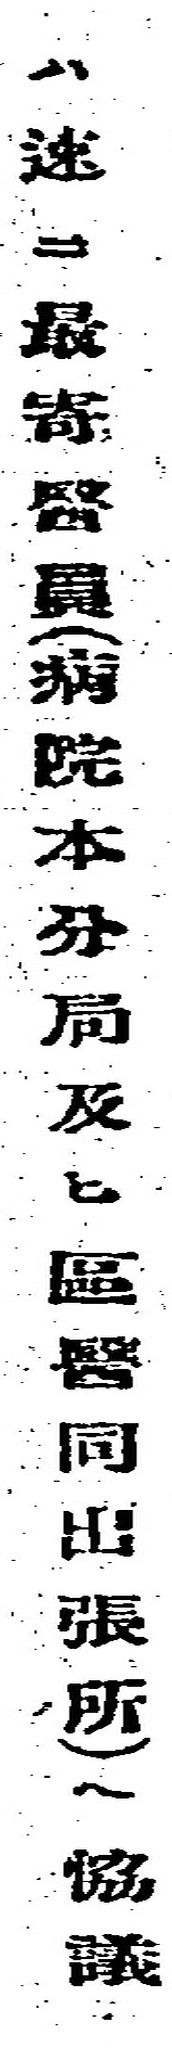ハ速ニ最寄医員(病院本分局及ヒ区医同出張所)へ協議
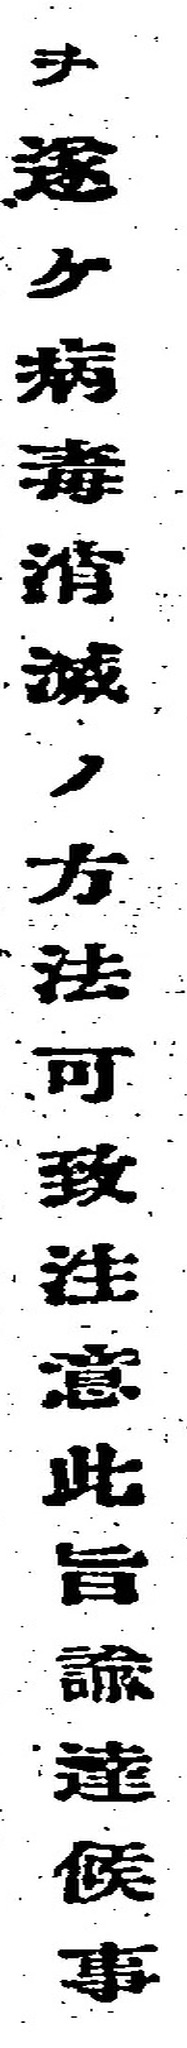ヲ遂ケ病毒消滅ノ方法可致注意此旨諭達候事

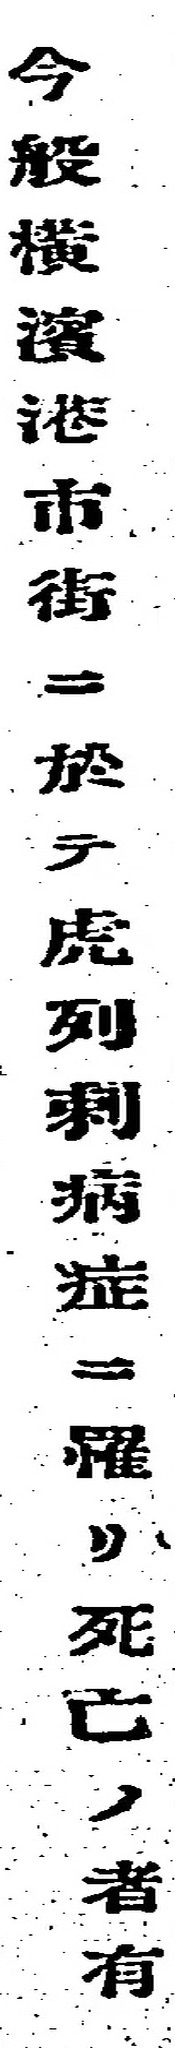今般横浜港市街ニ於テ虎列刺病症ニ罹リ死亡ノ者有
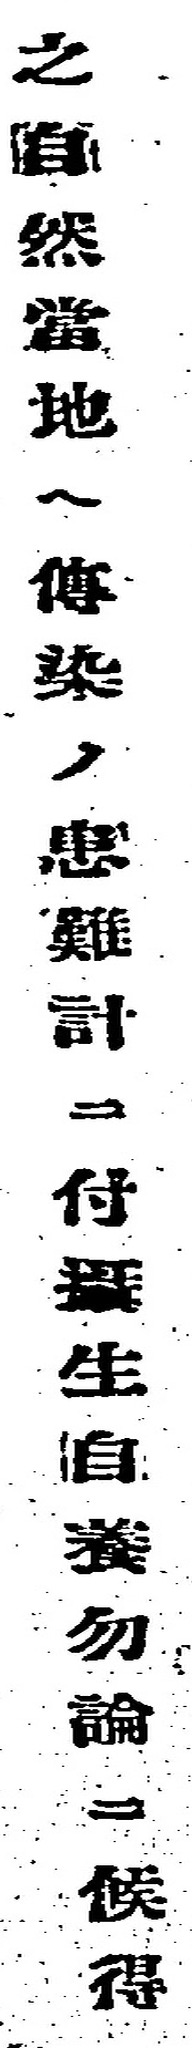之自然当地へ伝染ノ患難計ニ付摂生自養勿論ニ候得
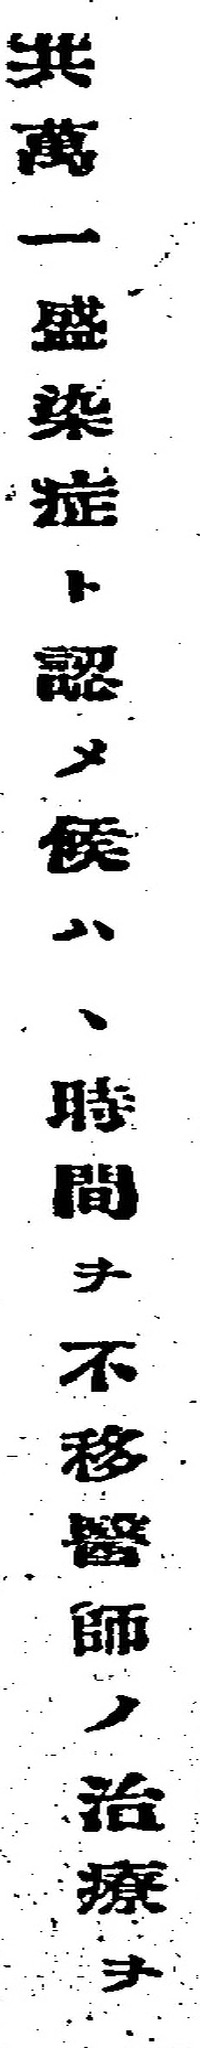共万一盛染症ト認メ候ハヽ時間ヲ不移医師ノ治療ヲ
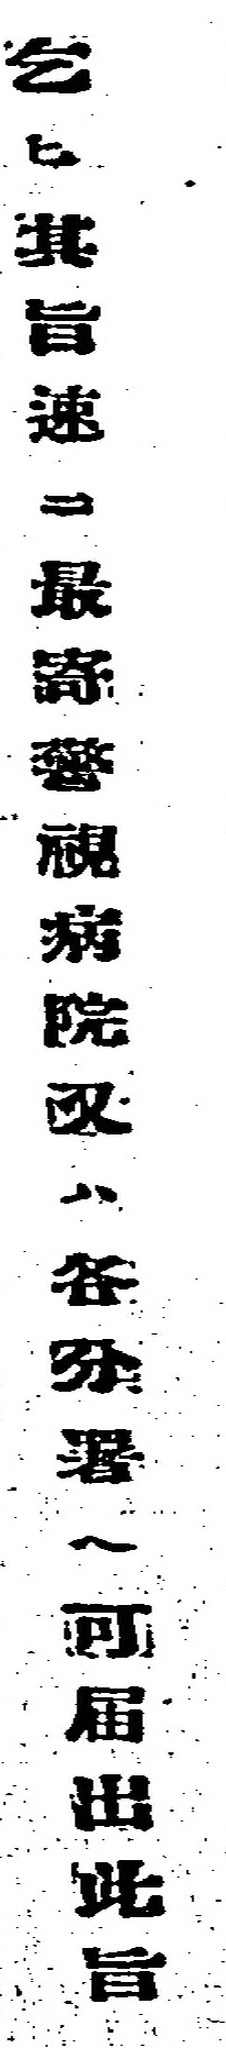乞ヒ其旨速ニ最寄警視病院又ハ各分署ヘ可届出此旨
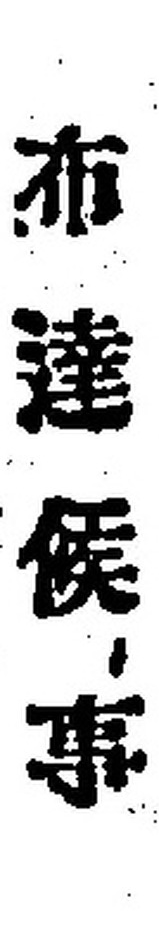布達候事
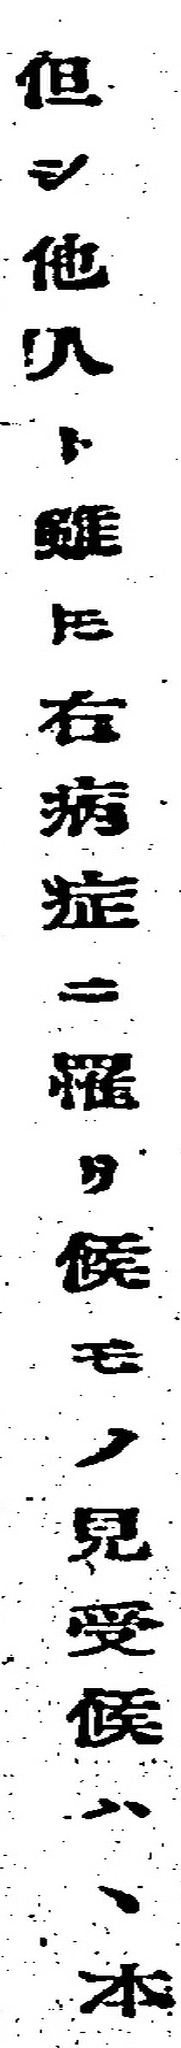但シ他人ト雖トモ右病症ニ罹リ候モノ見受候ハヽ本
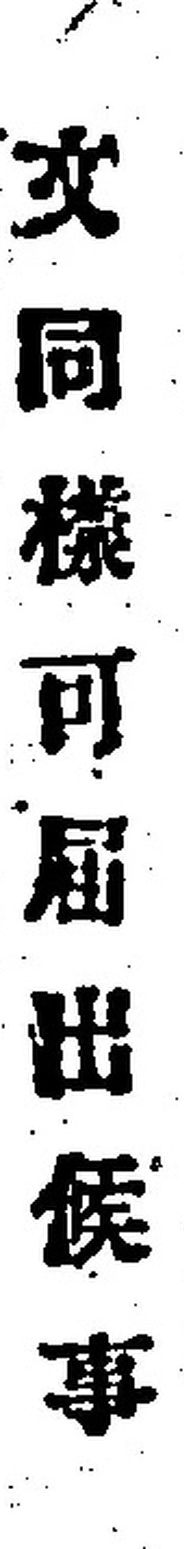文同様可届出候事
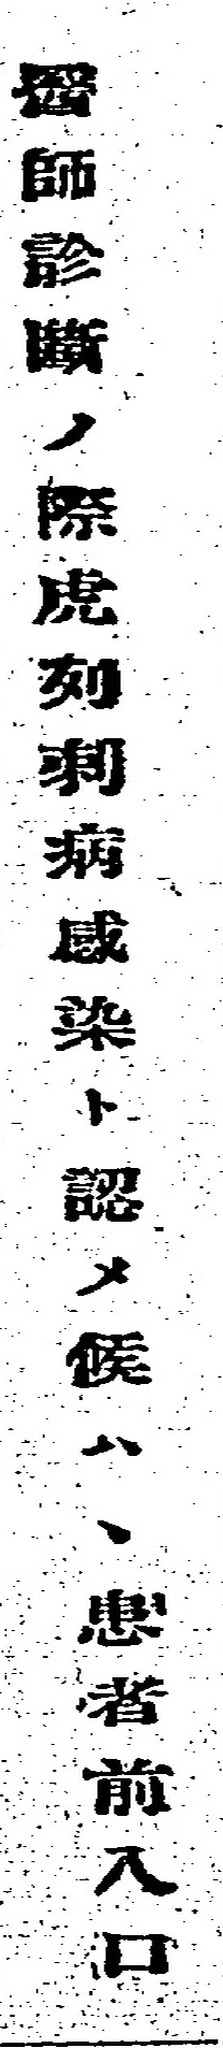医師診断ノ際虎列刺病感染ト認メ候ハヽ患者前入口
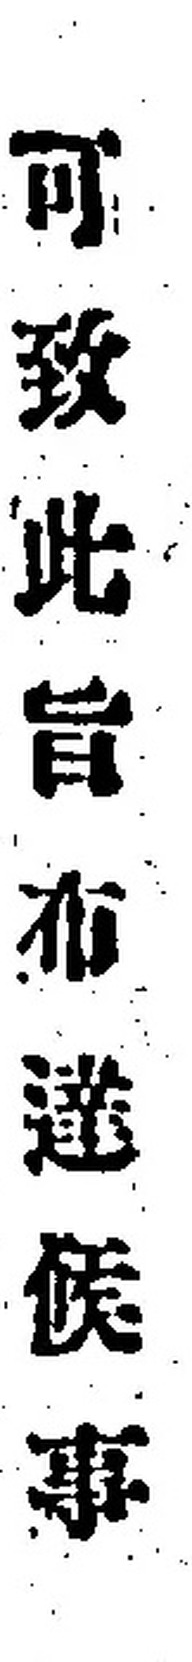可致此旨布達候事
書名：これら病予防心得
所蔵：国立国会図書館 National Diet Library, JAPAN
